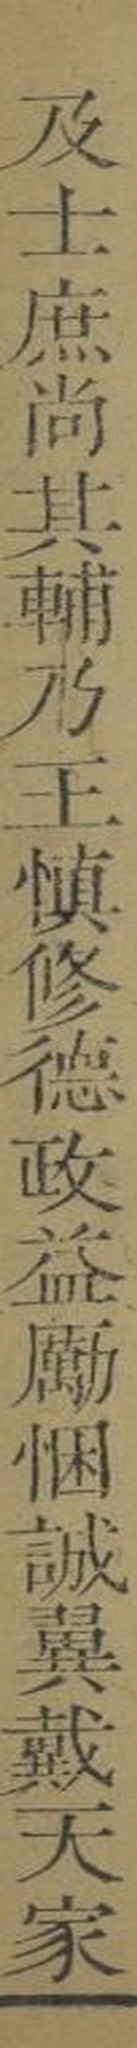及士庶尚其輔乃王慎修徳政益励悃誠翼戴天家

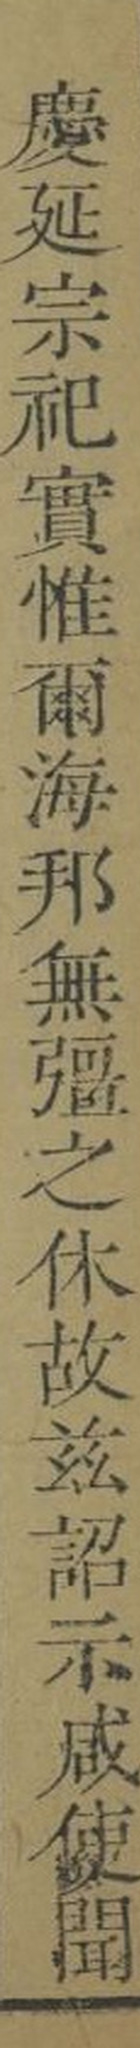慶延宗祀実惟爾海邦無彊之休故茲詔示咸使聞
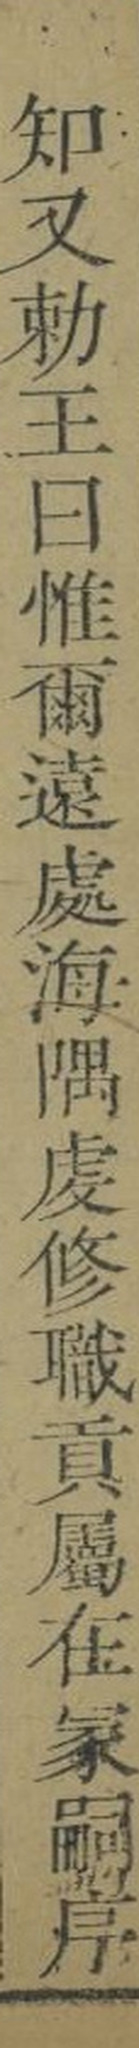知又勅王曰惟爾遠処海隅虔修職貢属在冡嗣序
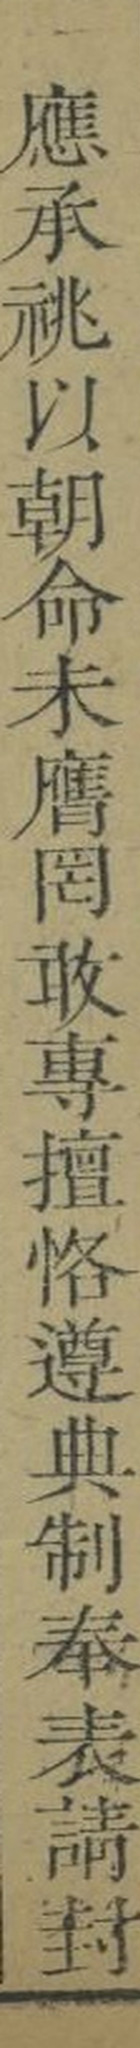応承祧以朝命未膺罔敢専擅恪遵典制奉表請封
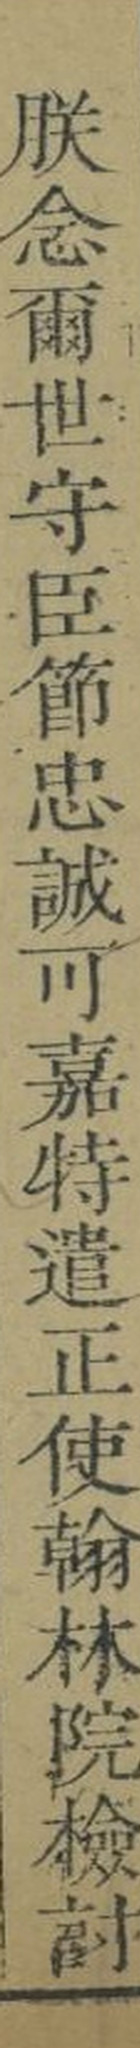朕念爾世守臣節忠誠可嘉特遣正使翰林院検討
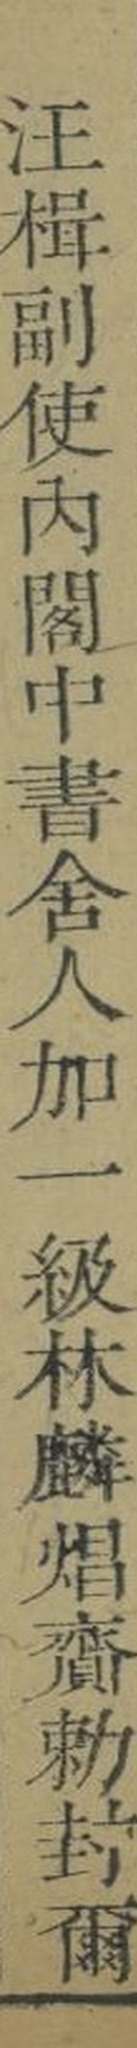汪楫副使内閣中書舎人加一級林麟焻齎勅封爾
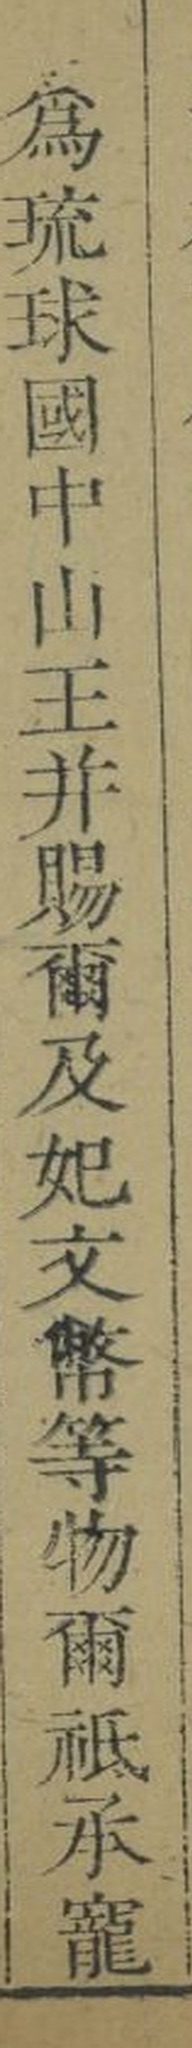為琉球国中山王并賜爾及妃文幣等物爾祇承寵
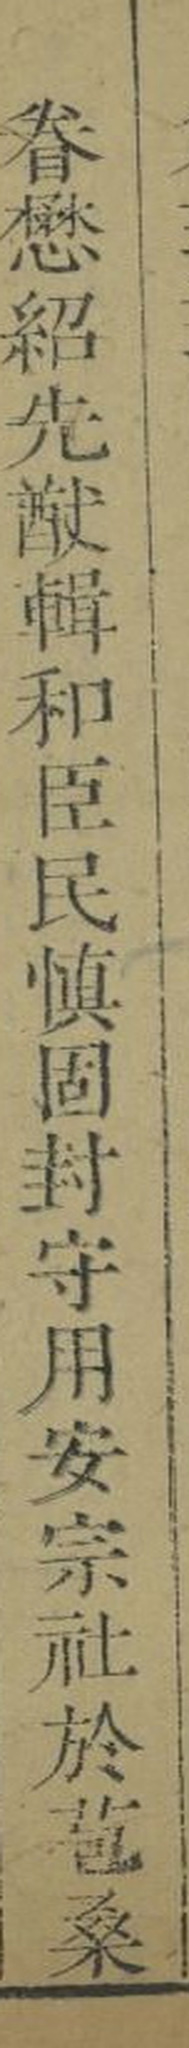眷懋紹先猷輯和臣民慎固封守用安宗社於苞桑
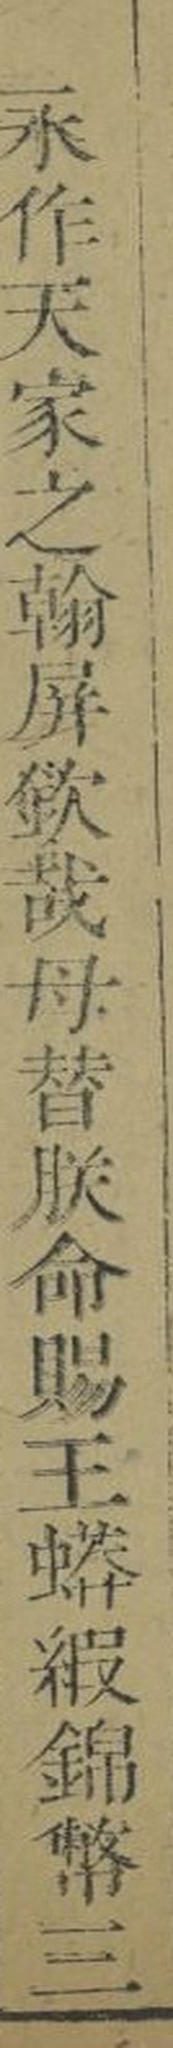永作天家之翰屏欽哉母替朕命賜王蟒緞錦幣三
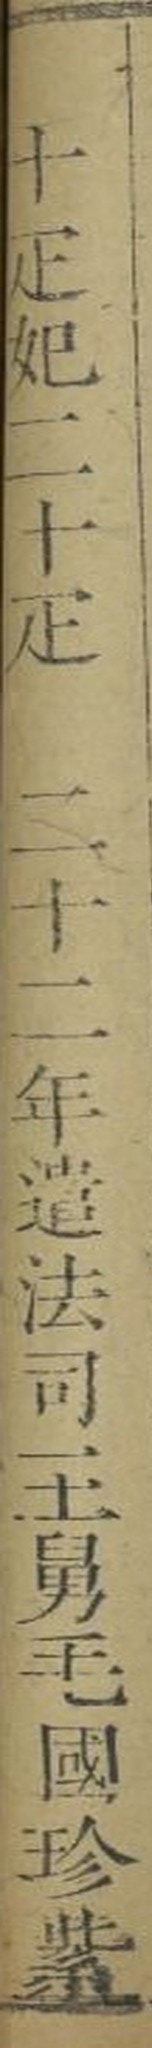十疋妃二十疋二十二年遣法司王舅毛国珍紫
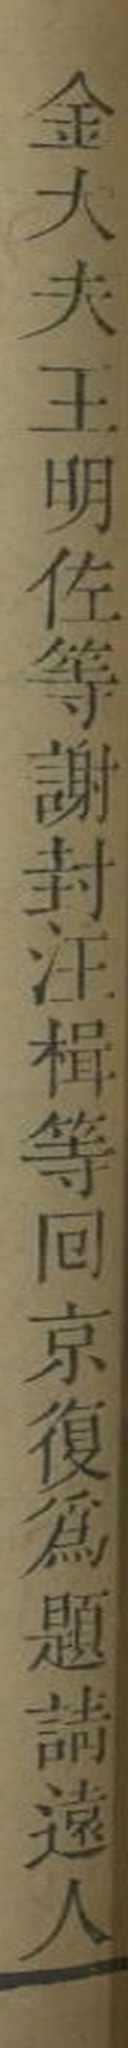金大夫王明佐等謝封汪楫等回京復為題請遠人
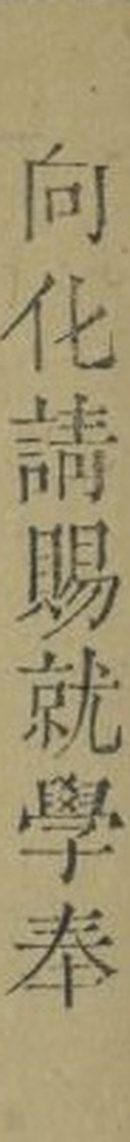向化請賜就学奉
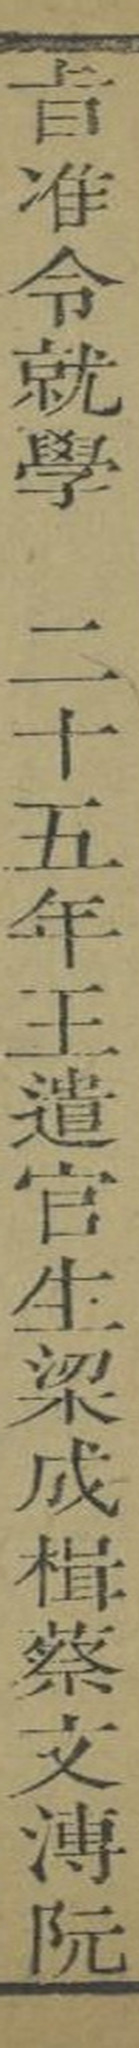旨准令就学二十五年王遣官生梁成楫蔡文溥阮
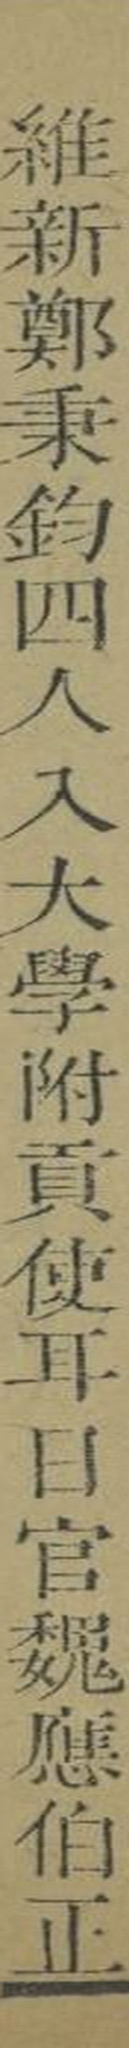維新鄭秉鈞四人入大学附貢使耳日官魏応伯正
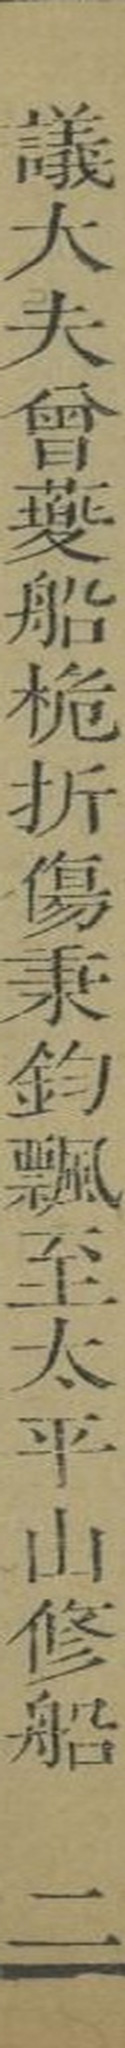議大夫曽䕫船桅折傷秉鈞飄至太平山修船二
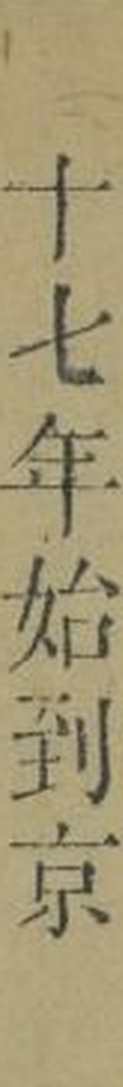十七年始到京
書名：中山伝信録 巻四
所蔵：University of the Ryukyus Library
